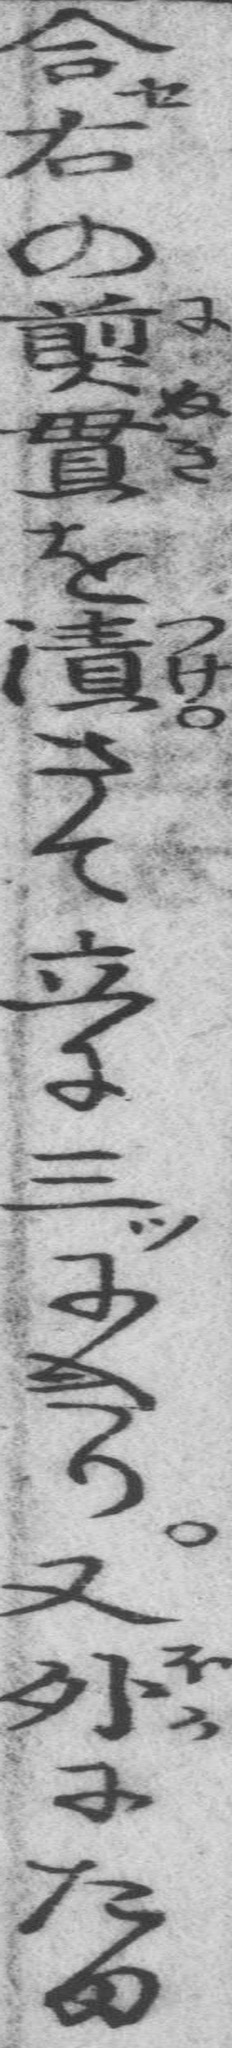合せ右の煎貫を漬。さて立に三ツにきり。又外にたま
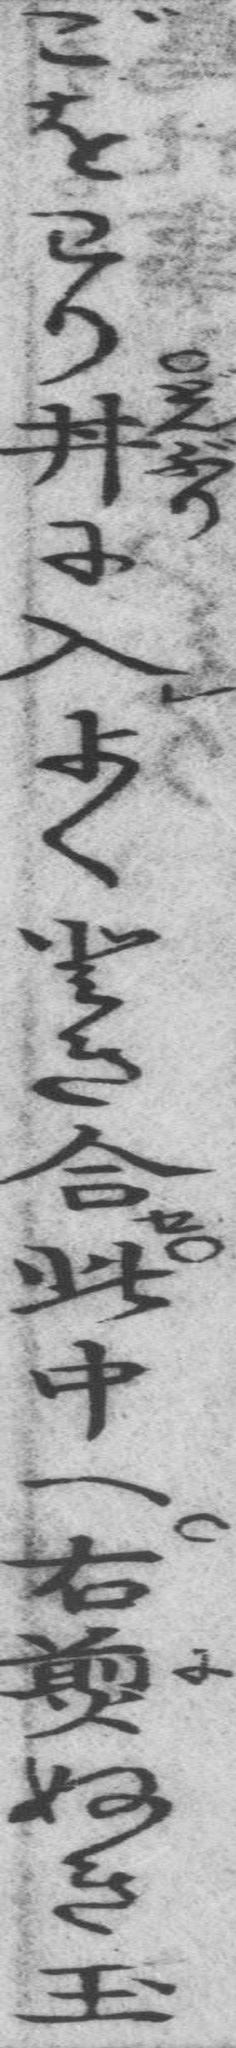ごをわり。丼に入れよくとき合せ。此中へ。右煎ぬき玉
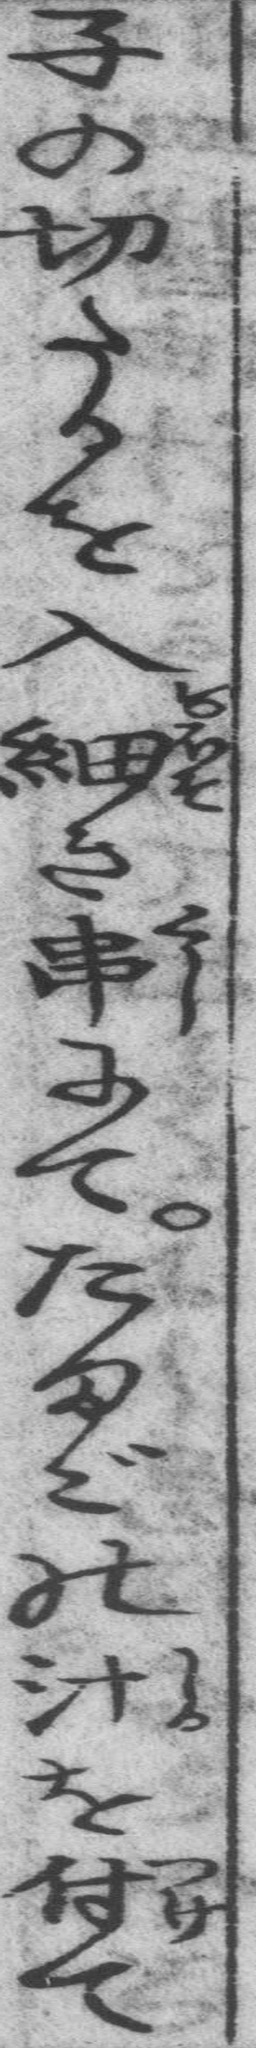子の切たるを入れ。細き串にて。たまごの汁を付て
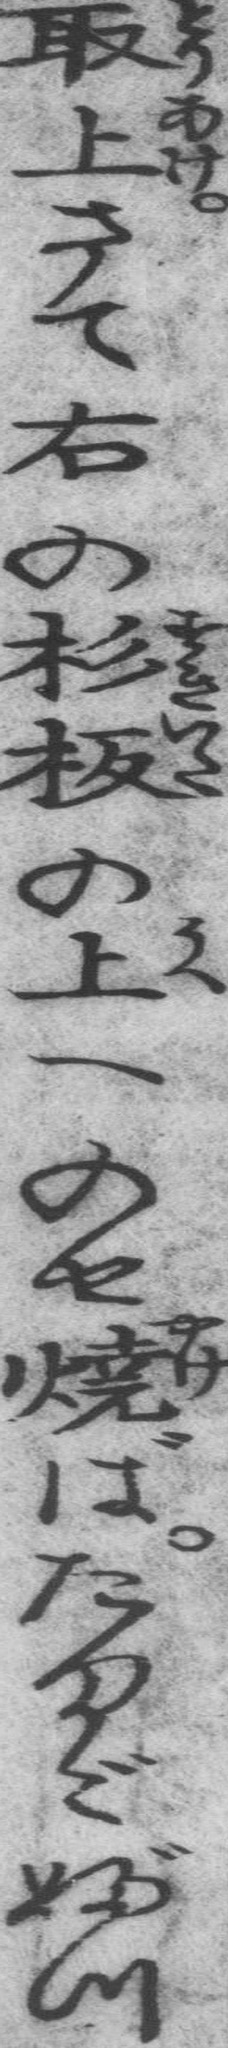取上。さて右の杉板の上へのせ焼ば。たまごぶつ
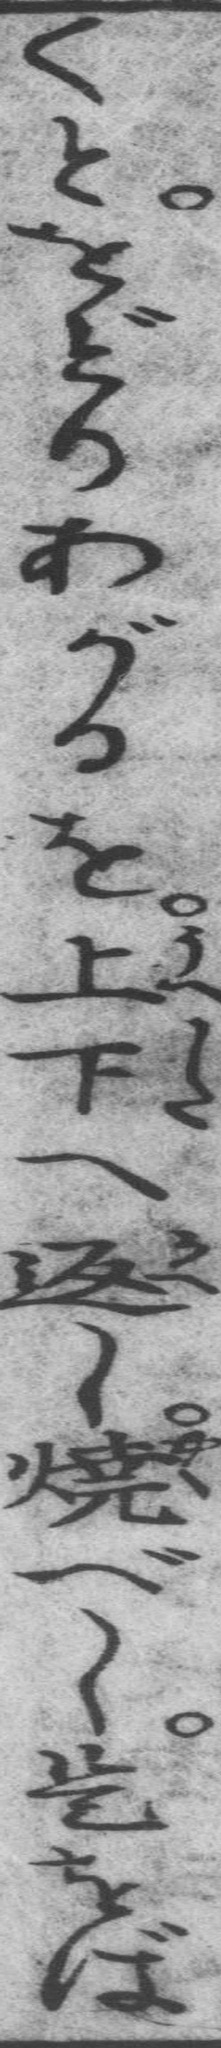〳〵と。をどりあがるを。上下へ返し。焼べし。是をば

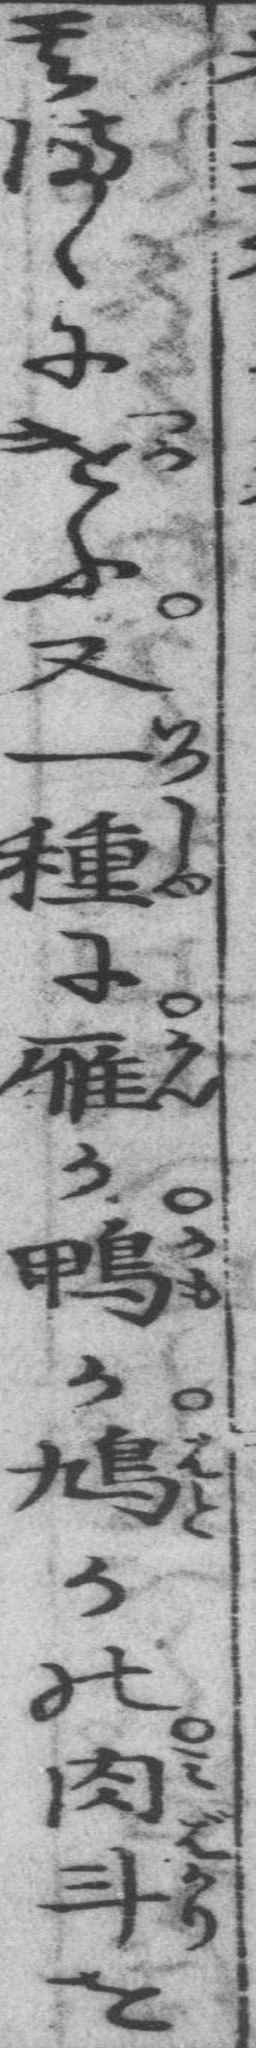其まゝに遣ふ。又一種に。雁か。鴨か。鳩かの。肉斗を
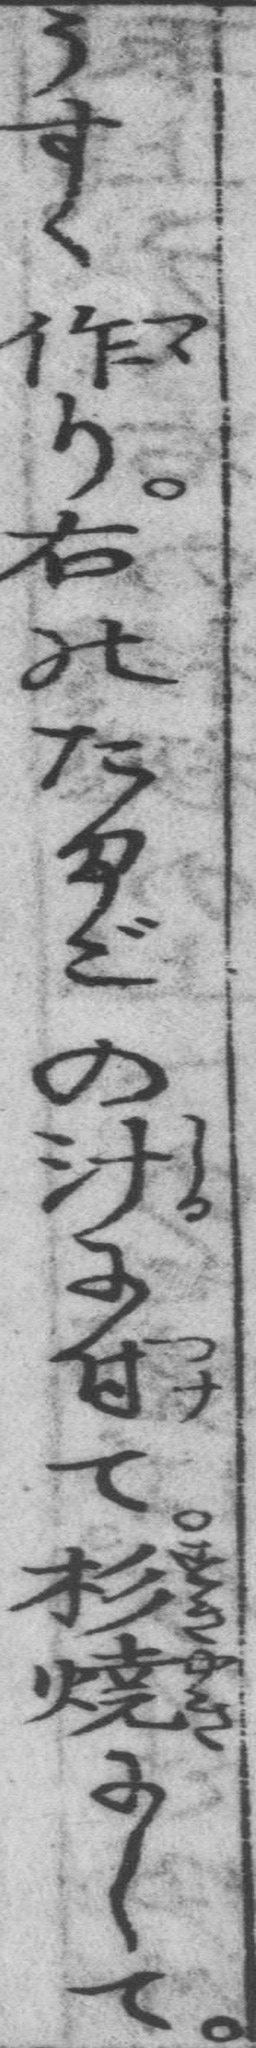うすく作り。右のたまごの汁に付て。杉焼にして。
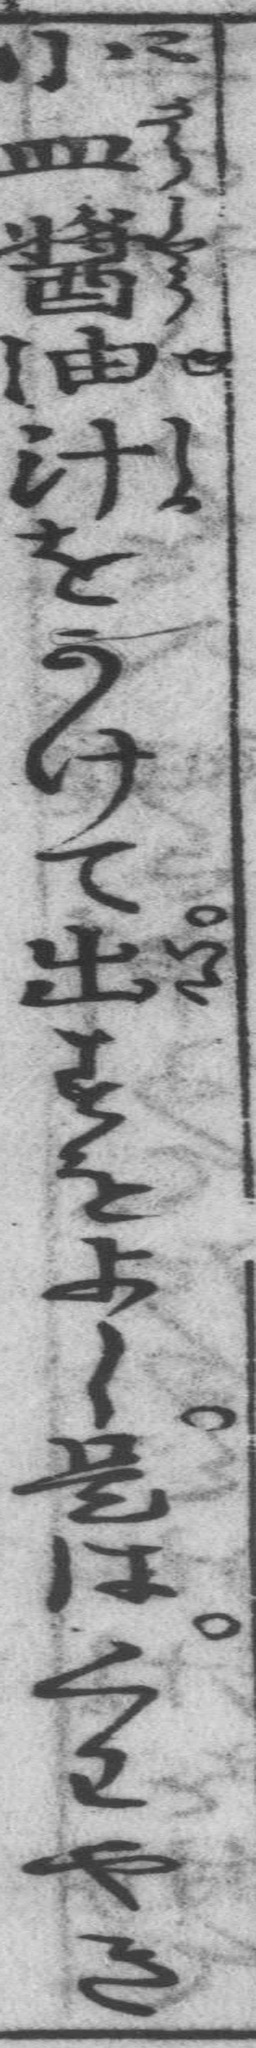小皿醤油汁をかけて。出すもよし。是は。くわやき
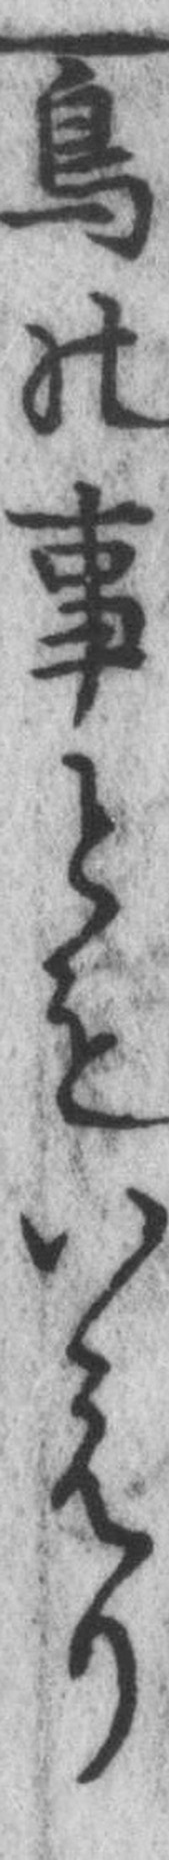鳥の。事ともいえり
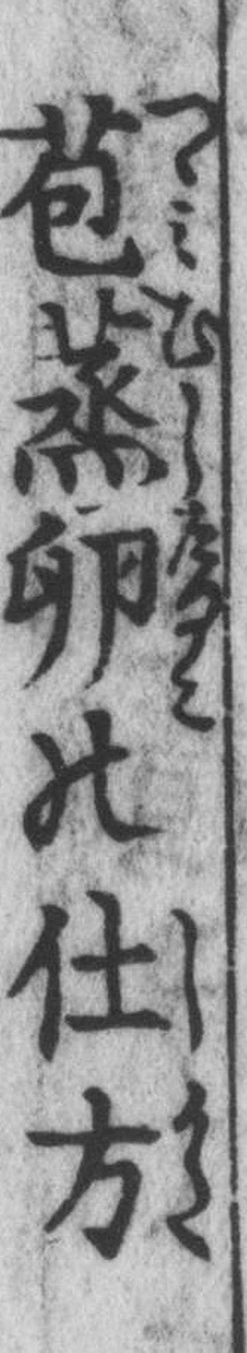苞蒸卵の仕方
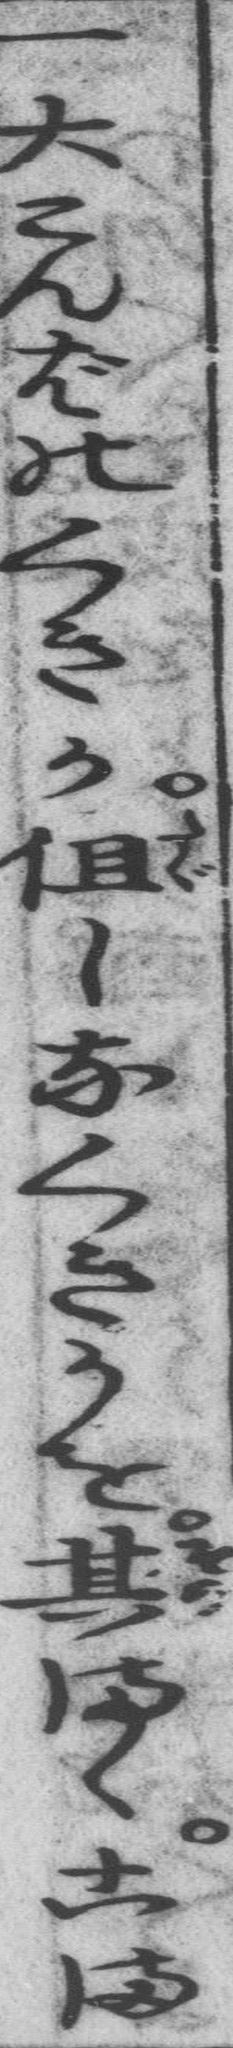一大こんばのくきか。但しなくきかを。其まゝ。こま
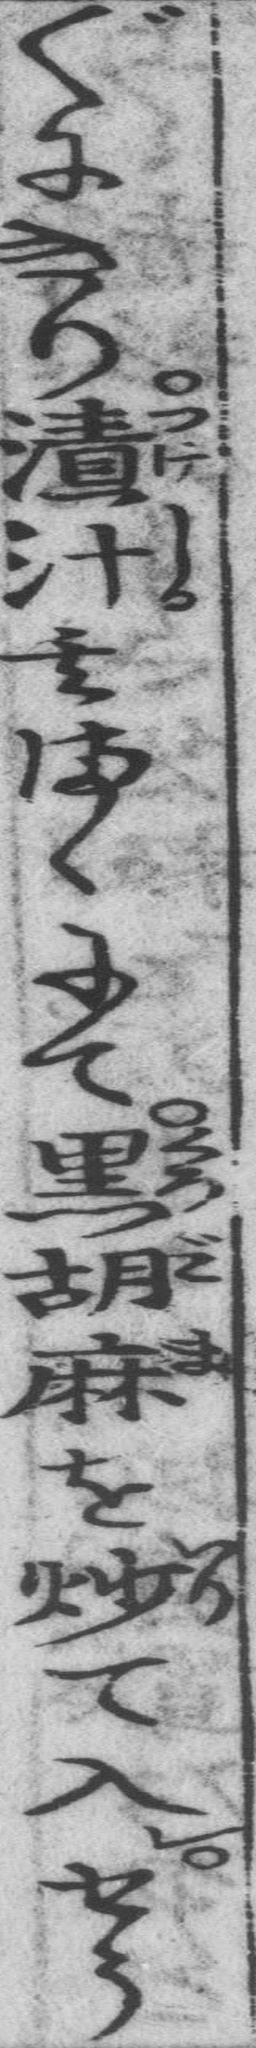〳〵にきり。漬汁其まゝにて。黒胡麻を炒て入れ。せう
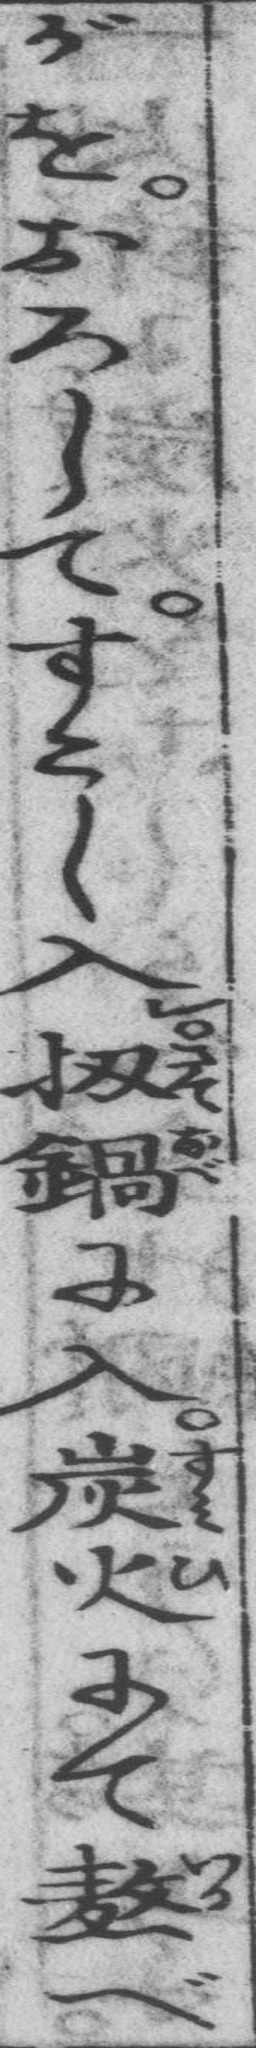がを。おろして。すこし入れ。扨鍋に入。炭火にて熬べ
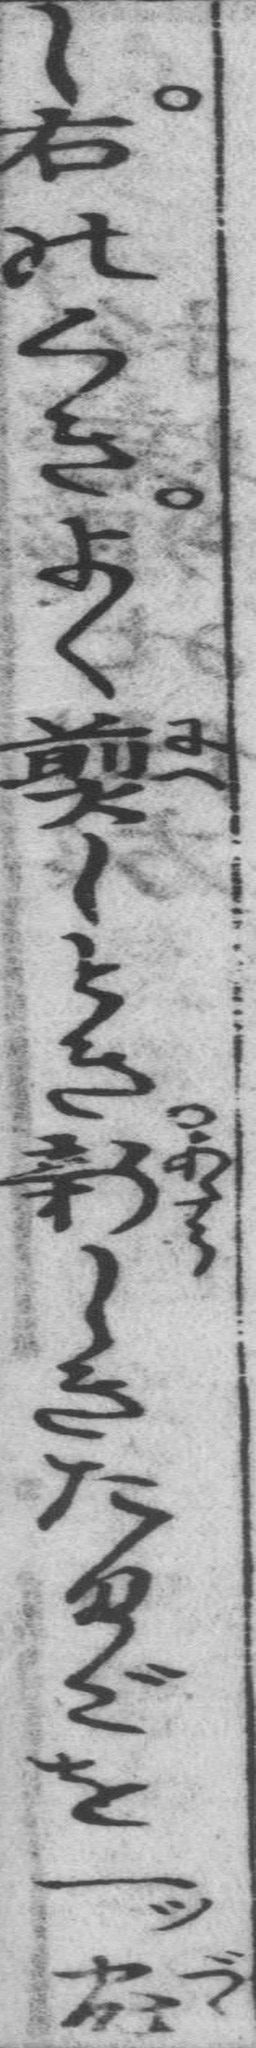し。右のくき。よく煎しとき。新しきたまごを一ツ宛
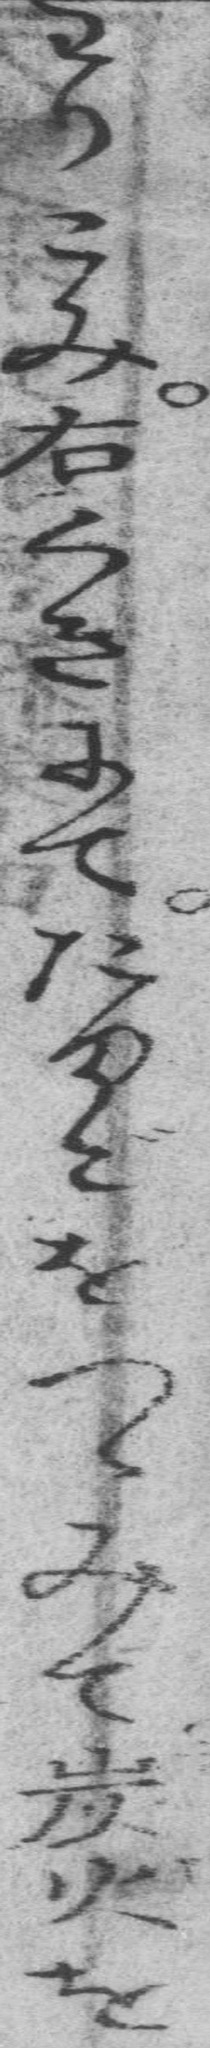わりこみ。右くきにて。たまごをつゝみて。炭火を
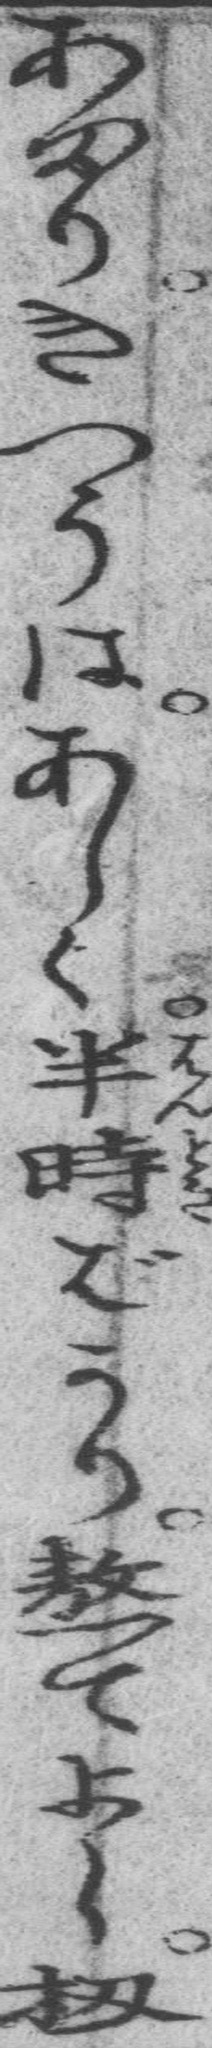あふり。きつうは。あしく。半時ばかり。熬てよし。扨
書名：萬寳料理秘密箱
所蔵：大阪府立大学学術情報センター 国文学研究資料館
